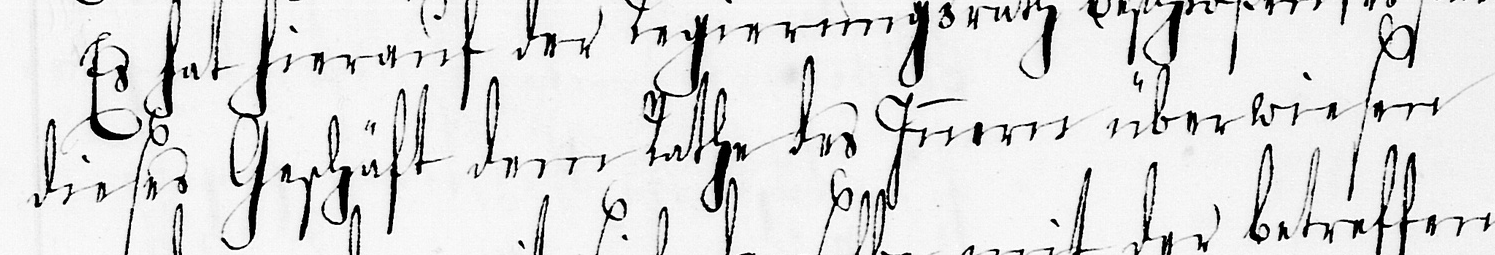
dieses Geschäft dem Rathe des Innern überwiesen
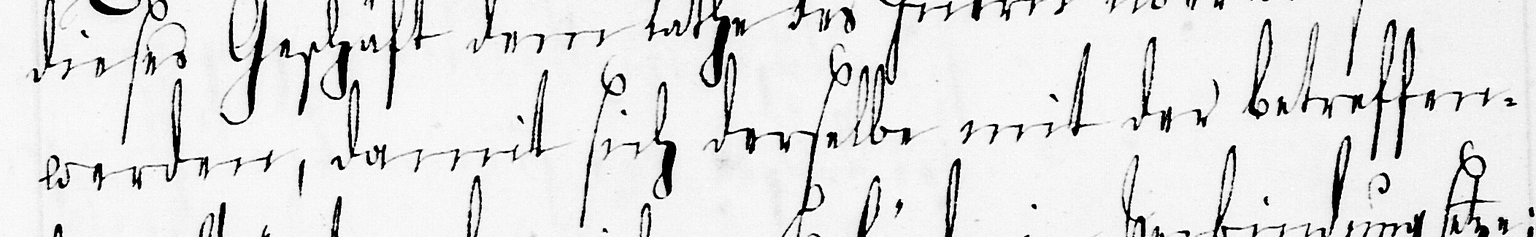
werden, damit sich derselbe mit der betreffen¬
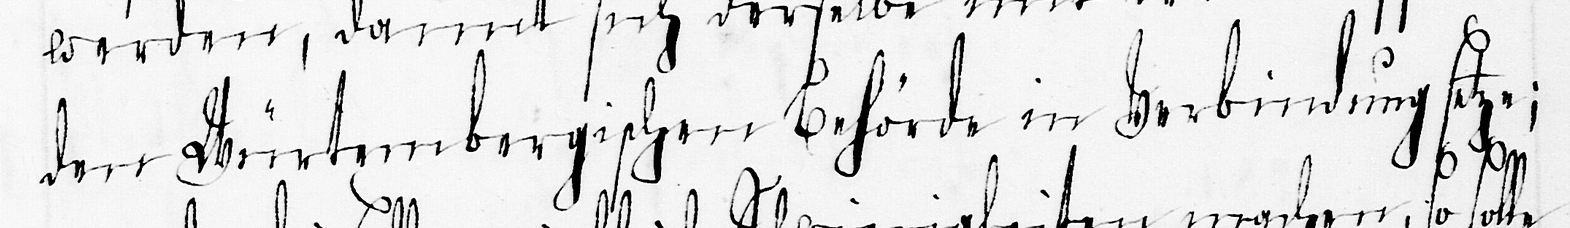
den Würtembergischen Behörde in Verbindung setze;
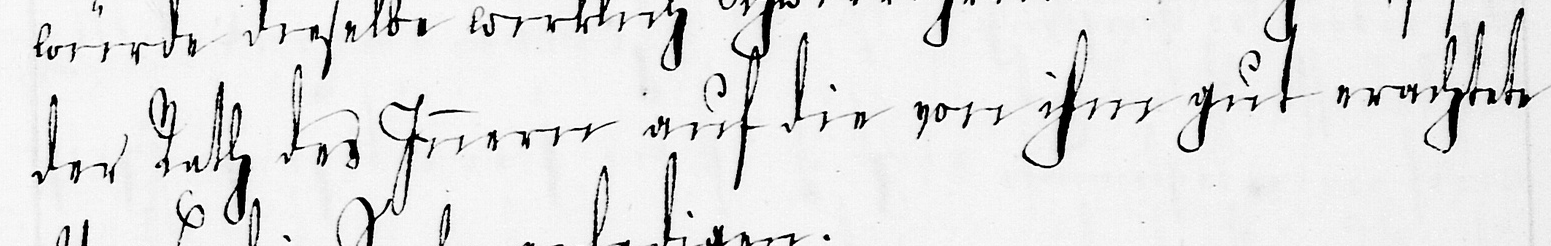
der Rath des Innern auf die von ihm gut erachtete
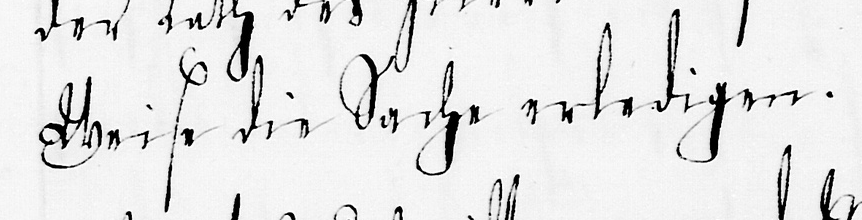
Weise die Sache erledigen.
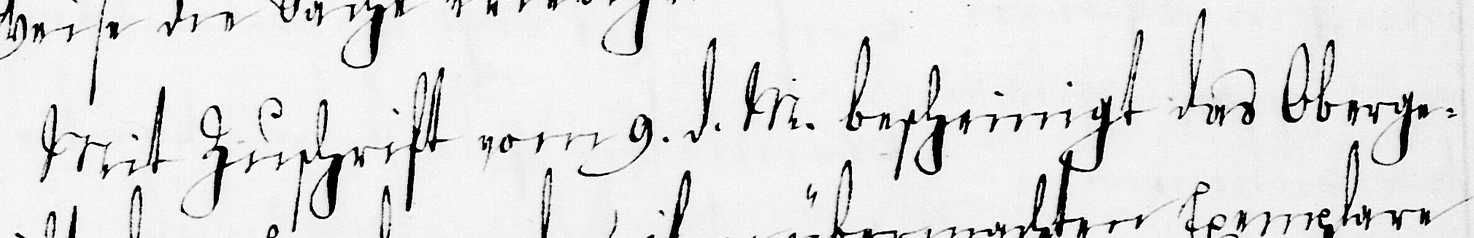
Mit Zuschrift vom 9. d. M. bescheinigt das Oberge¬
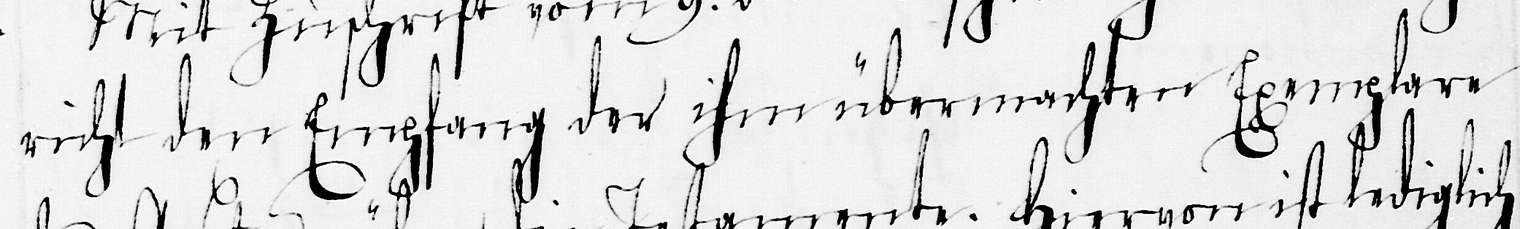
richt den Empfang der ihm übermachten Exemplare
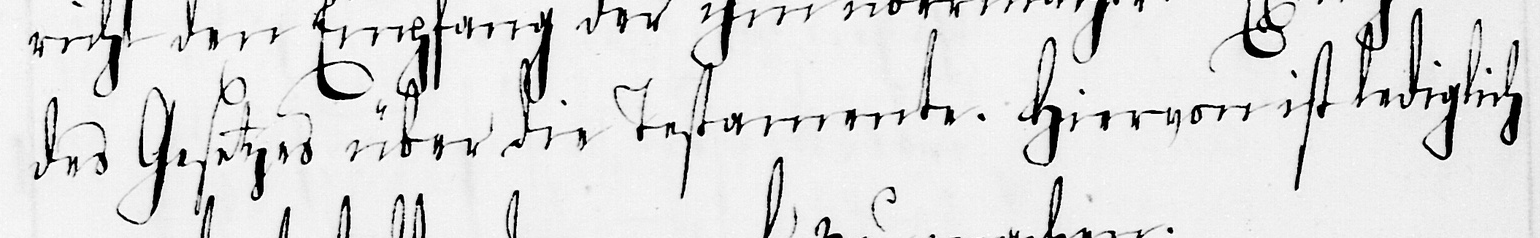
des Gesetzes über die Testamente. Hiervon ist lediglich
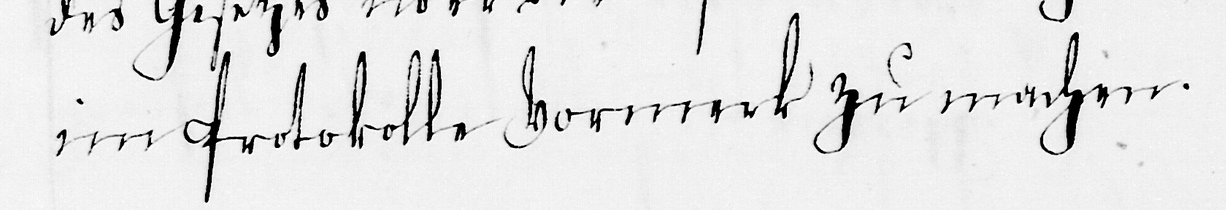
im Protokolle Vormerk zu machen.
